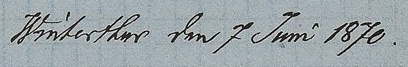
Winterthur den 7 Juni 1870.
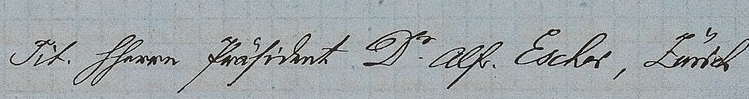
Tit. HHerrn Präsident Dr Alfr. Escher, Zürich
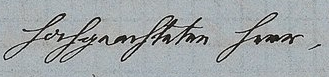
Hochgeachteter Herr,
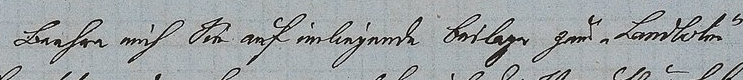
Beehre mich Sie auf inliegende Beilage zum «Landboten»
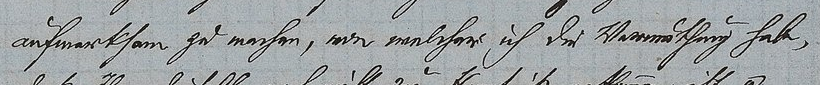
aufmerksam zu machen, von welcher ich die Vermuthung habe,
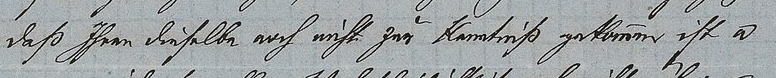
daß Ihnen dieselbe noch nicht zur Kenntniß gekommen ist &
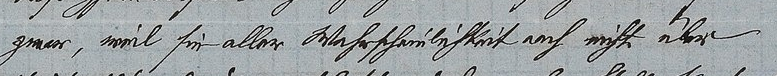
zwar, weil sie aller Wahrscheinlichkeit nach nicht über
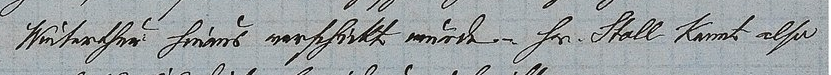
Winterthur hinaus verschickt wurde. – Hr. Stoll kennt also
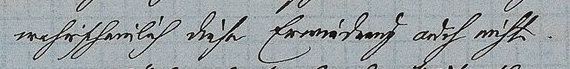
wahrscheinich diese Erwiederung auch nicht.
